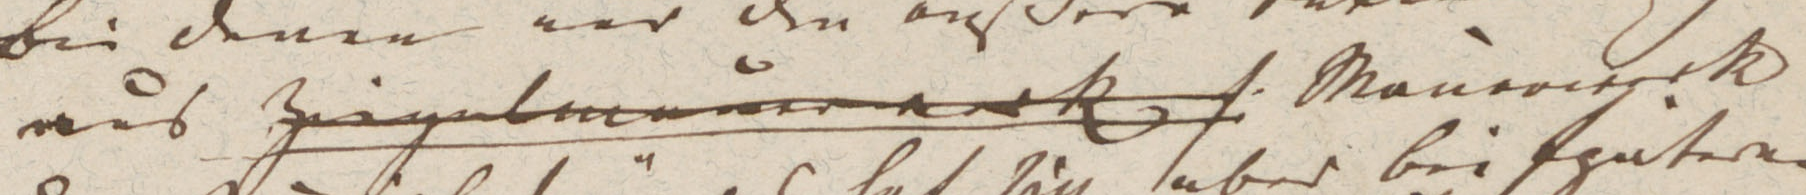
aus Ziegelmauerwerk Mauerwerk
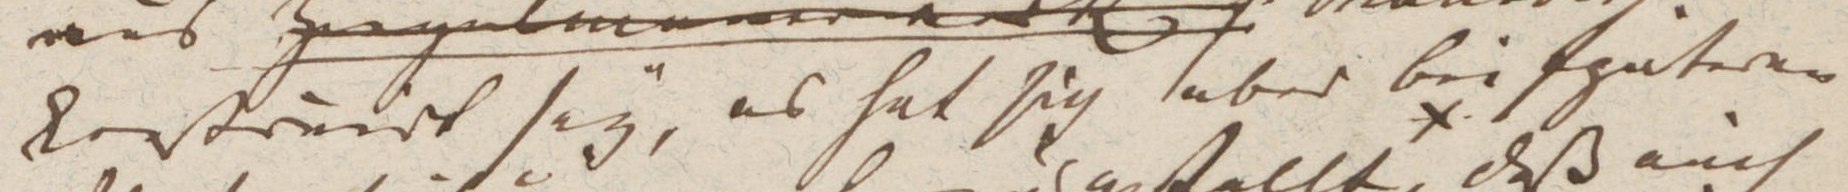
konstruirt sey, es hat sich aber bei späteren
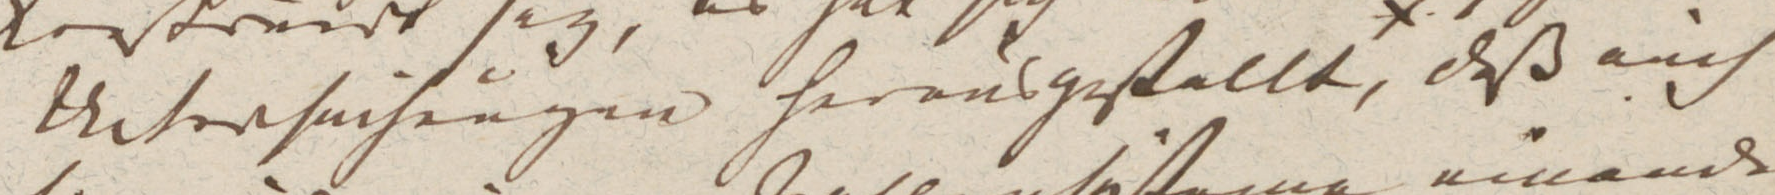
Untersuchungen herausgestellt, % dass auch
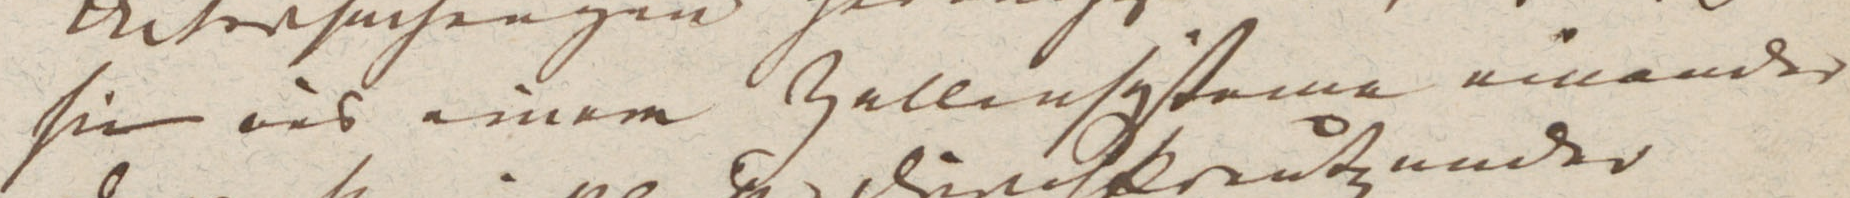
sie aus einem Zellensysteme einander
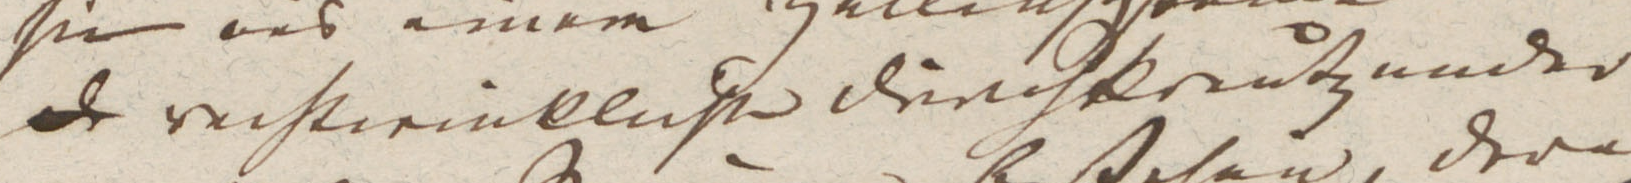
d rechtwinklicht durchkreutzender
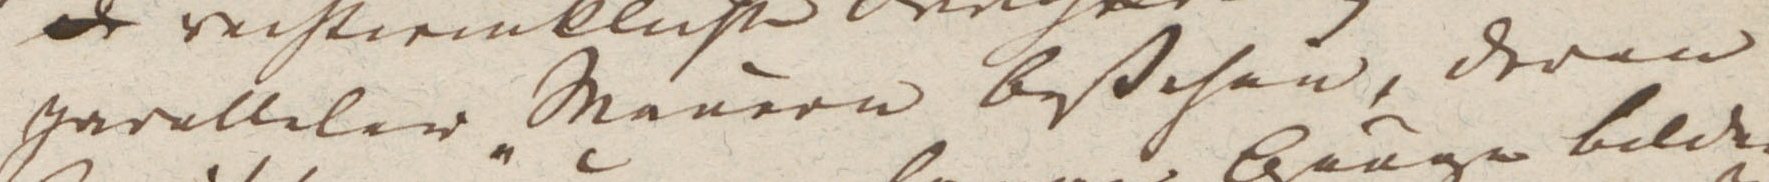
paralleler Mauern bestehen, deren
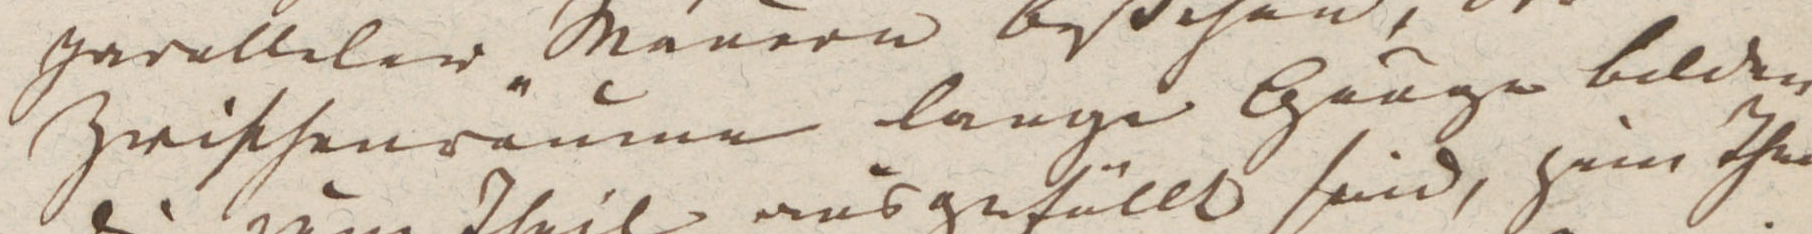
Zwischenräume lange Gänge bilden
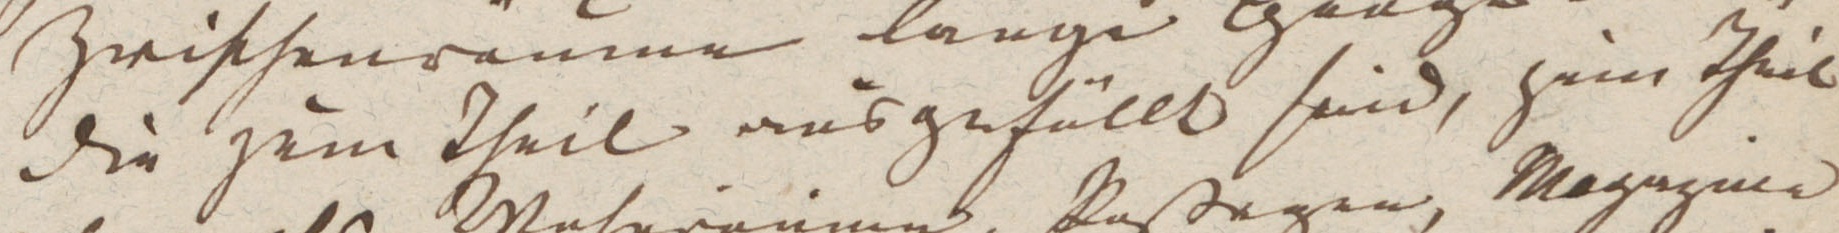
die zum Theil ausgefüllt sind, zum Theil
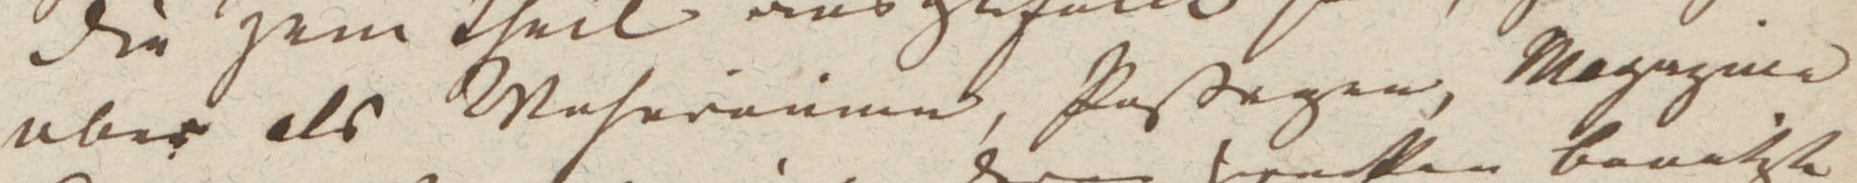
aber als Wohnräume, Passagen, Magazine
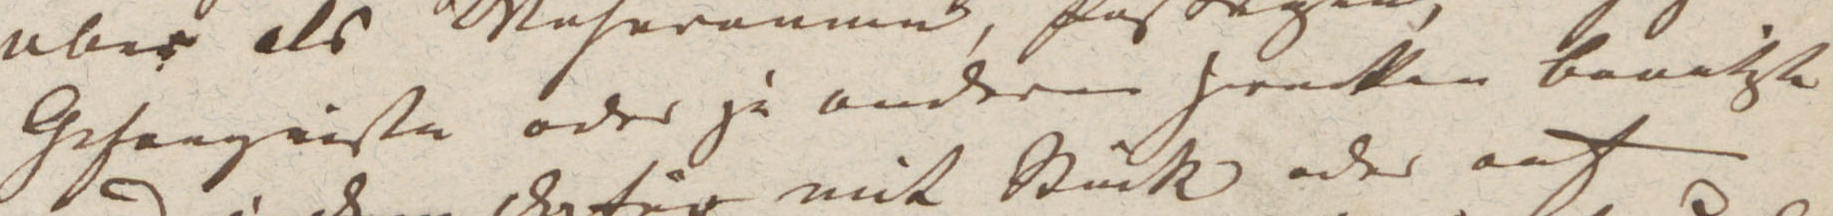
Gefangnisse oder zu anderen Zwecken benützt
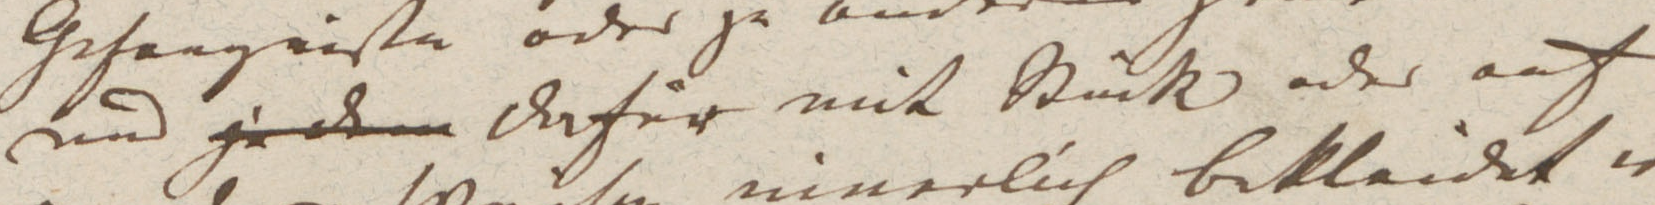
und j dem dafür mit Stuck oder auf
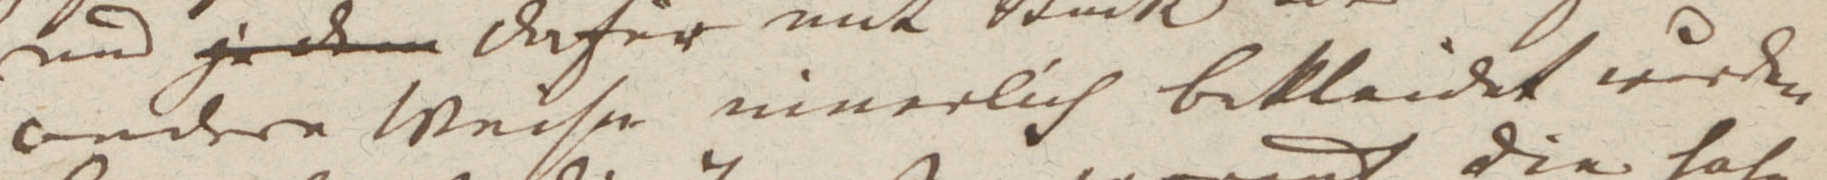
andere Weise innerlich bekleidet wurden.
